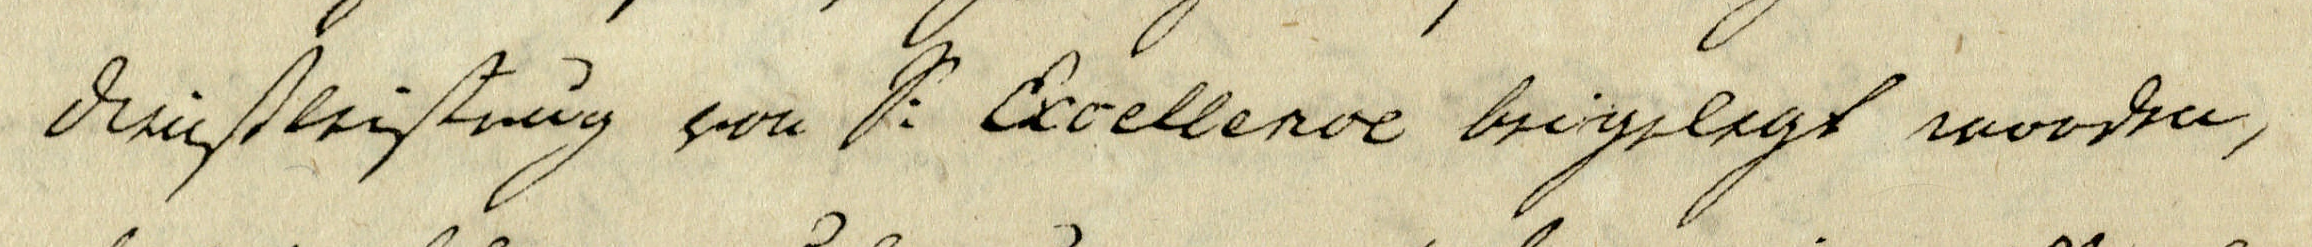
Dienstleistung von Sr Excellence beigelegt worden,
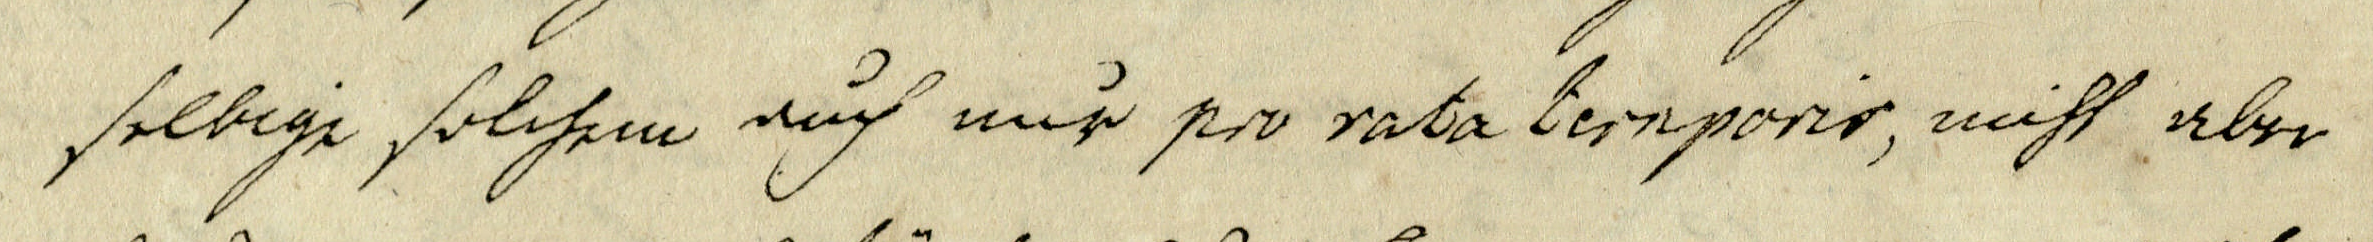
selbige solchem auf nur pro rata temporis, nicht aber
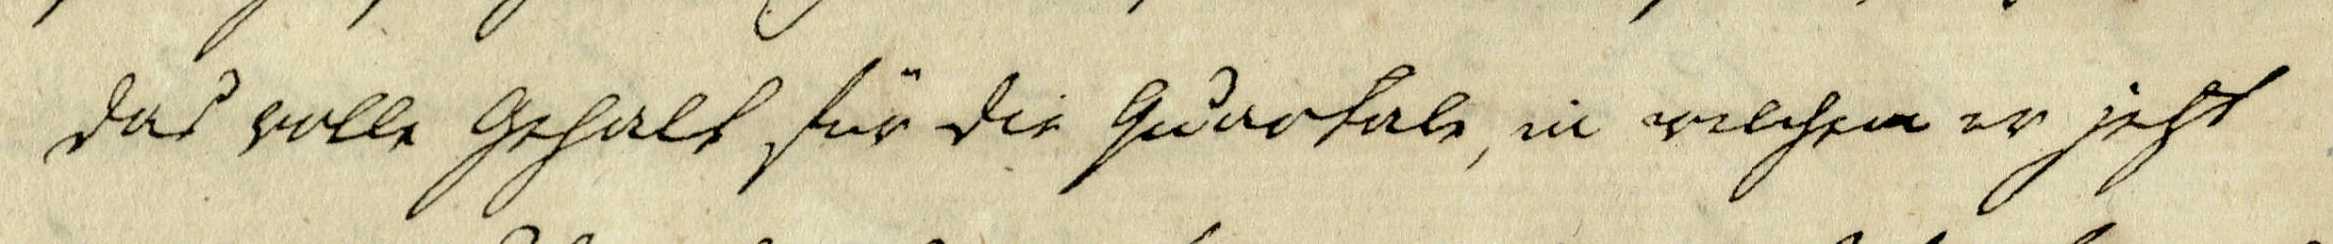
das volle Gehalt für die Quartale, in welchem er jetzt
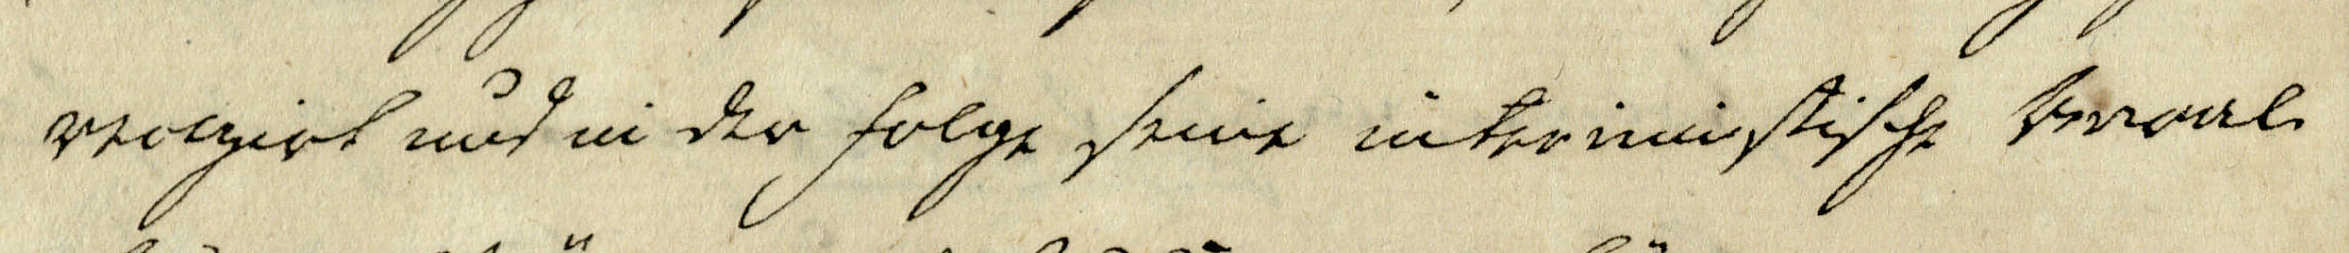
recipirt und in der Folge seine interimistische Verwal¬
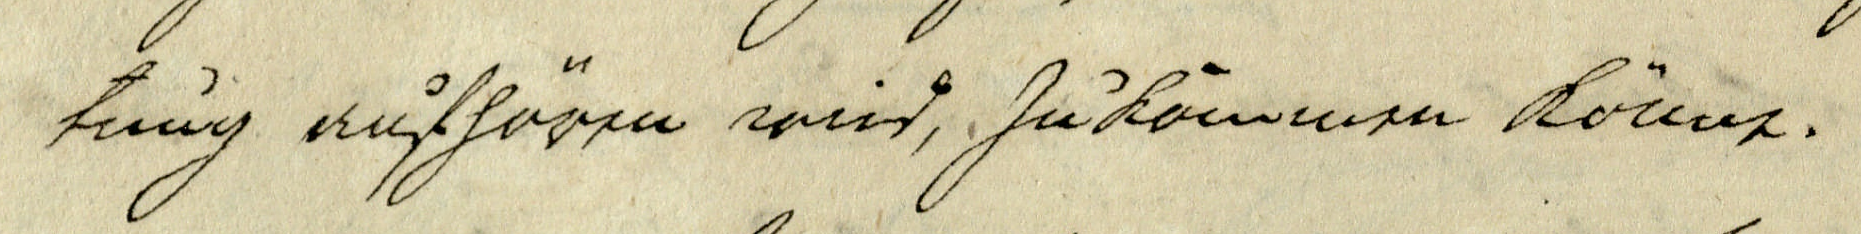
tung aufhören wird, zukommen könne.
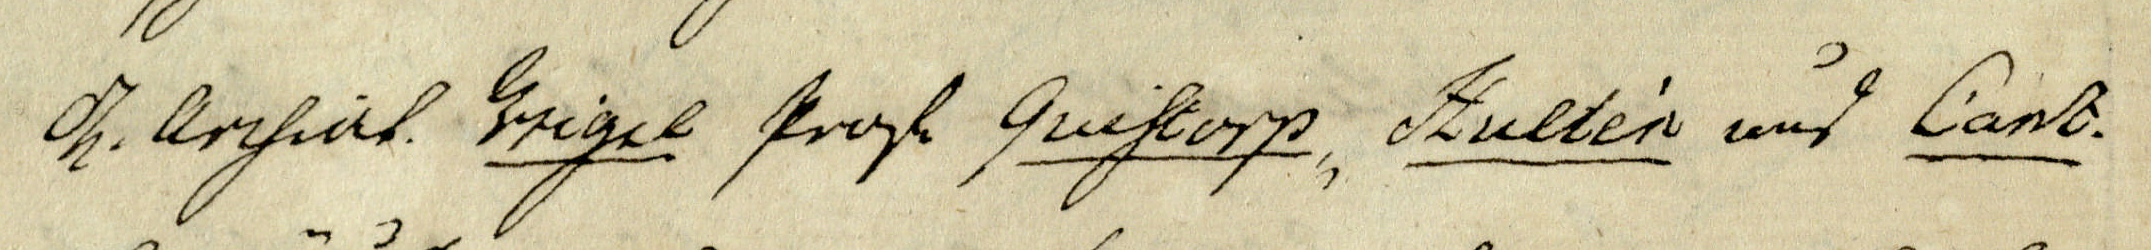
dh. Archiat. Weigel Prof. Quistorp, Hultén und Canz¬
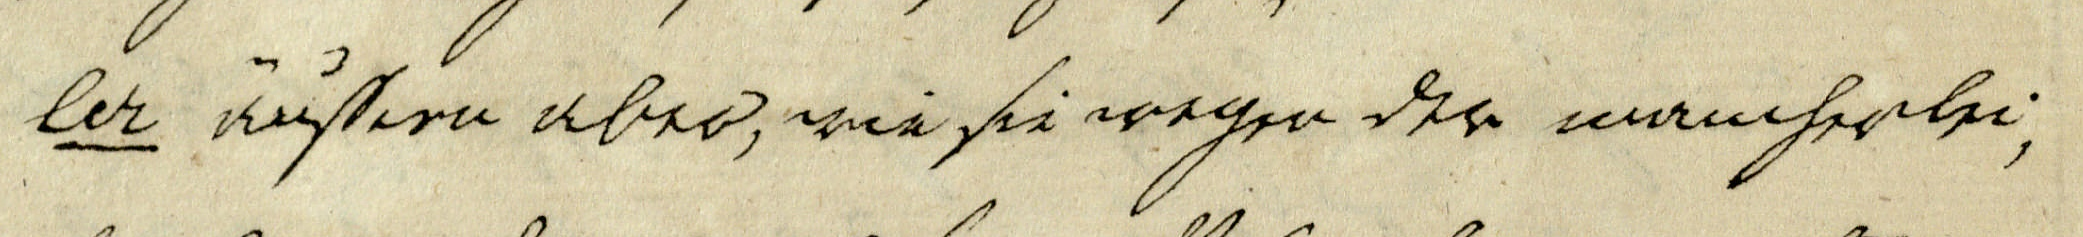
ler äussern aber, wie sie wegen der mancherlei,
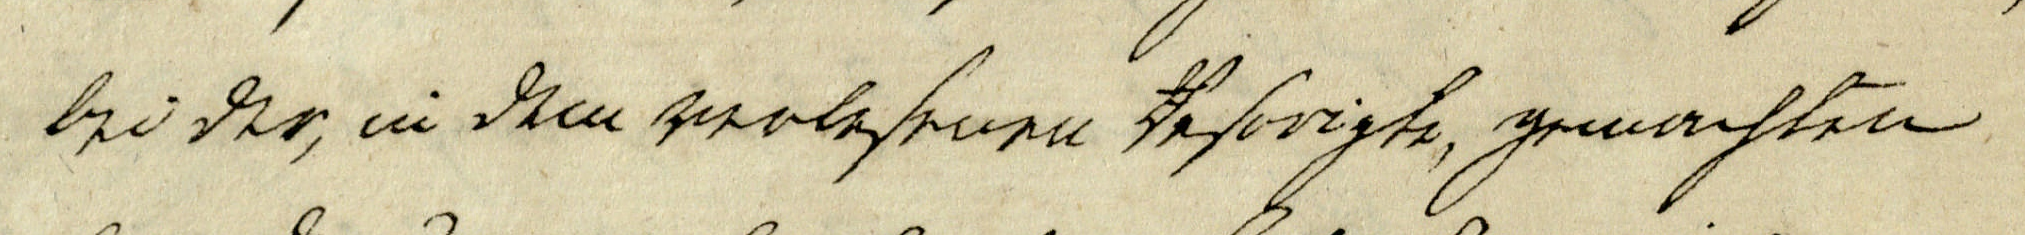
bei der, in dem verlesenen Rescripte, gemachten
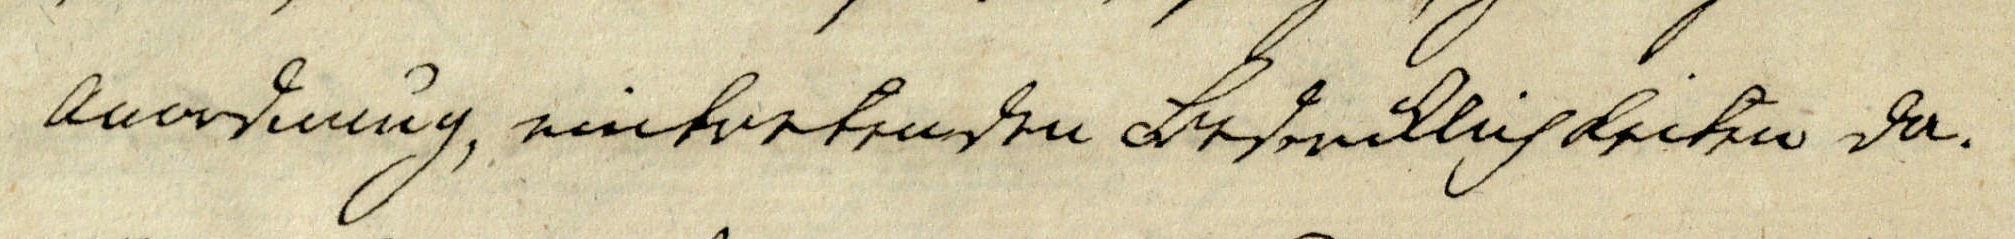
Anordnung, eintretenden Bedencklichkeiten da¬
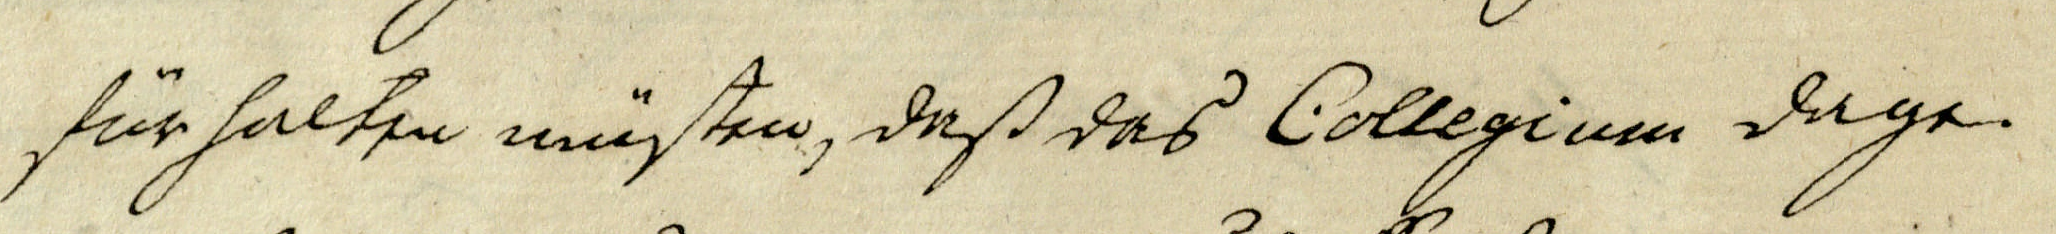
für halten müsten, daß das Collegium dage¬
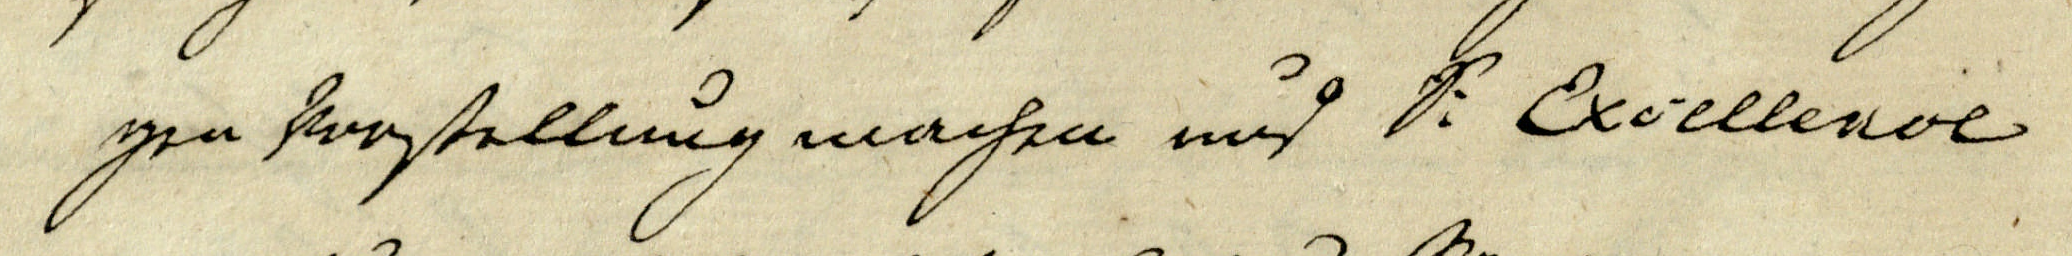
gen Vorstellung machen und Sr. Excellence
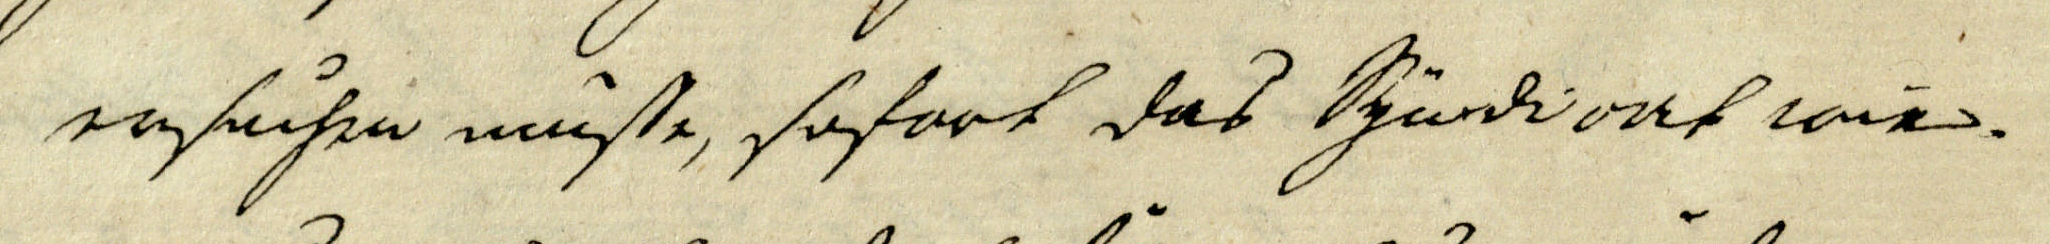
ersuchen müsse, sofort das Sÿndicat wie¬
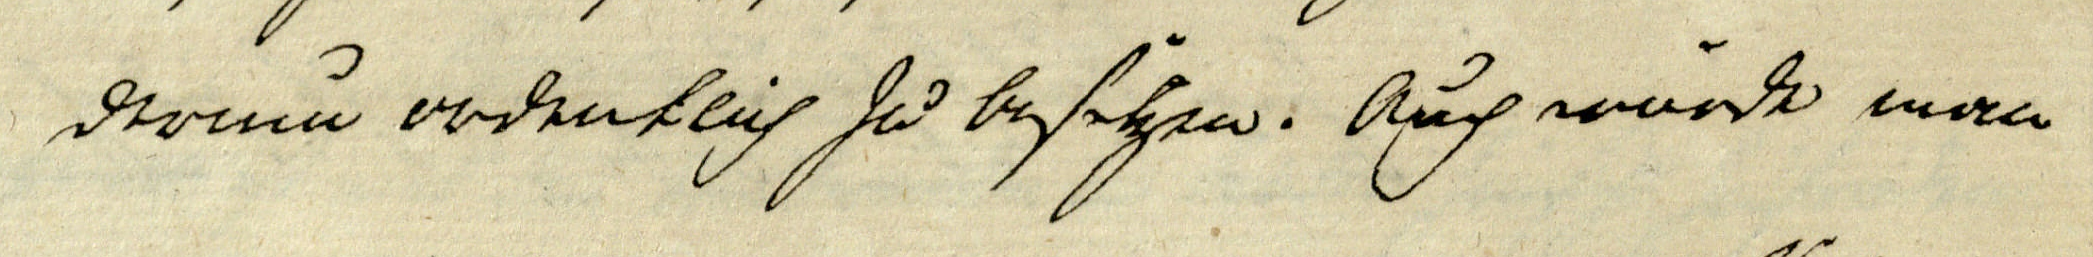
derum ordentlich zu besetzen. Auch würde man
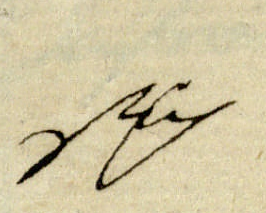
sich
